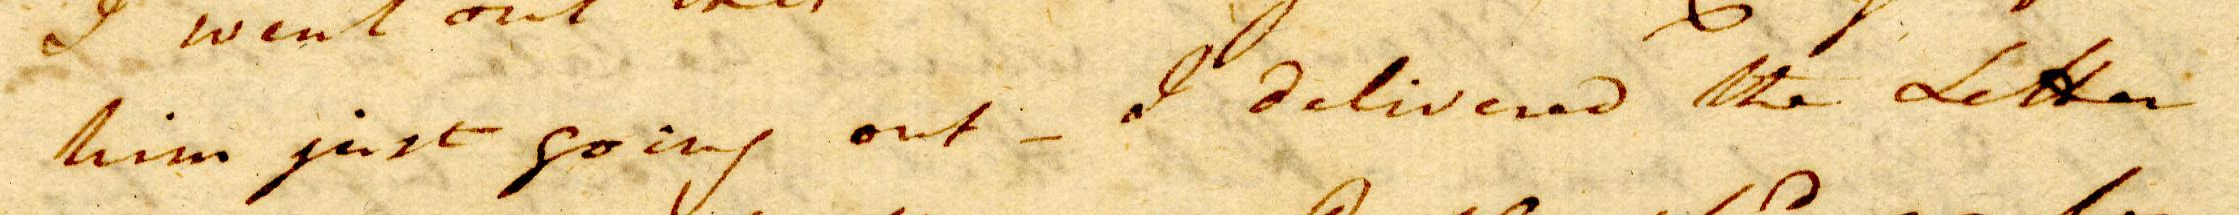him just going out. I delivered the Letter
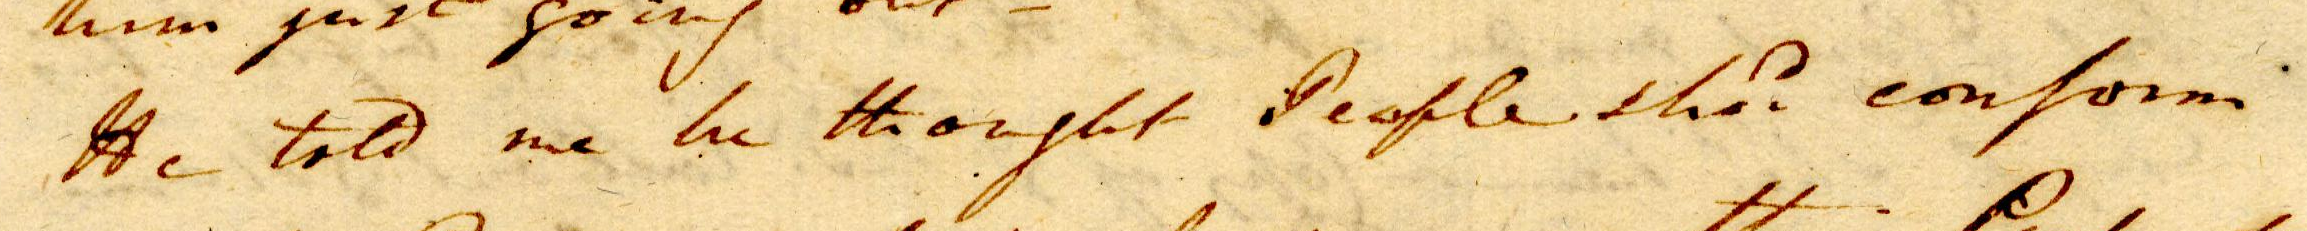He told me he thought People sho^d. conform
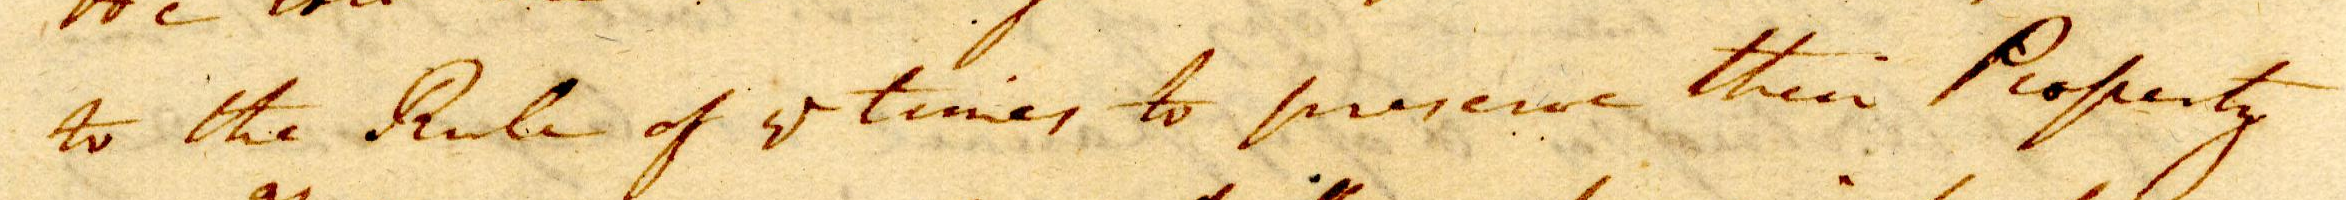to the Rule of y^e times to preserve their Property
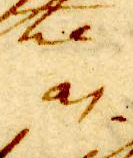as
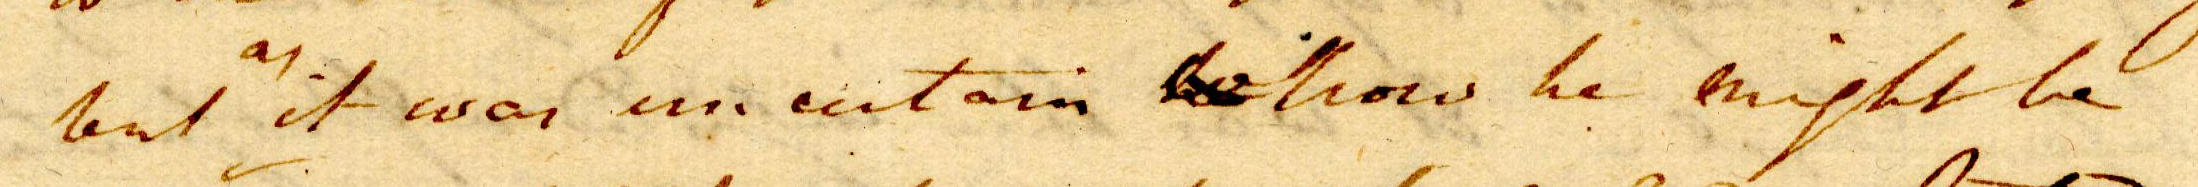lest ^ it was uncertain how he might be
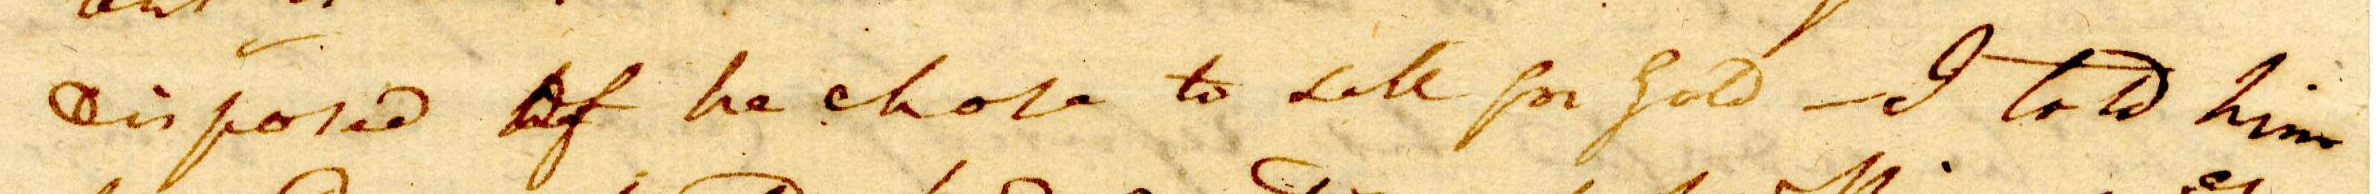disposed if he chose to late for Gold. I told him
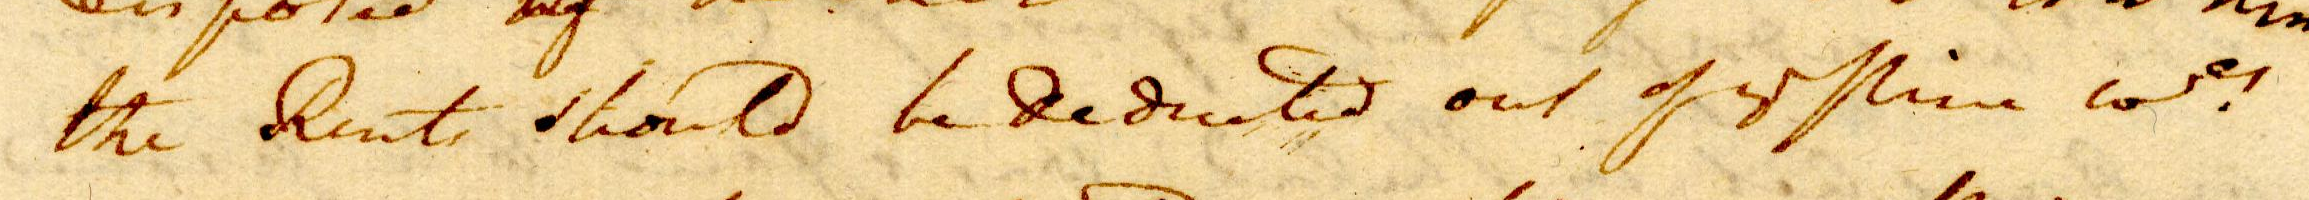the Rent should be deducted out of y^e pine w^ch.
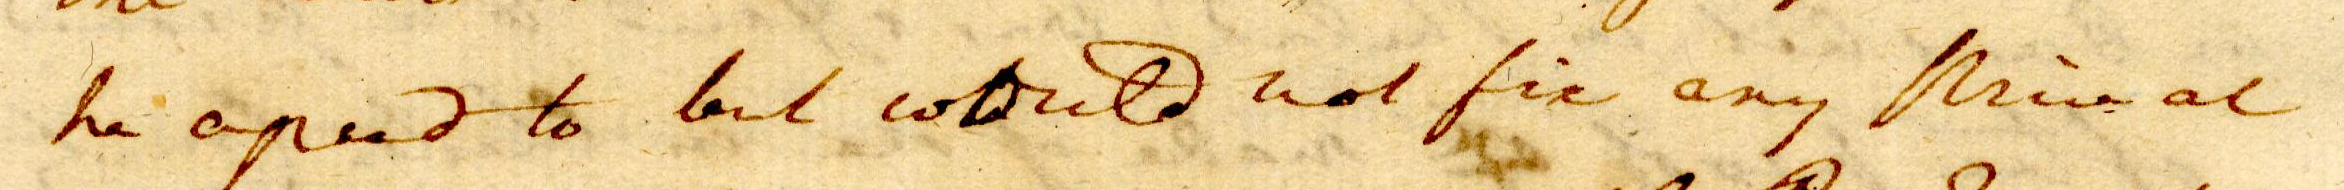he agreed to but would not fix any prival
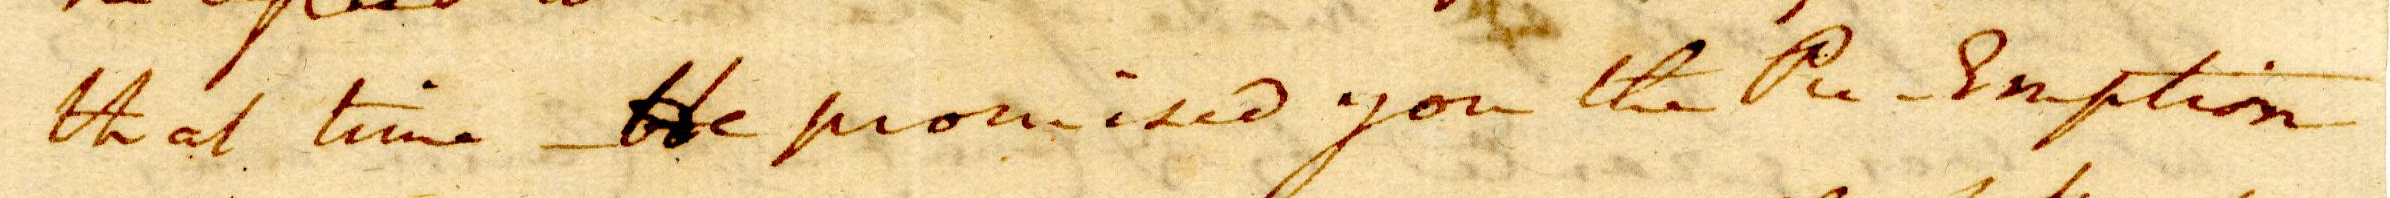that time. He promised you the Pre-Emption
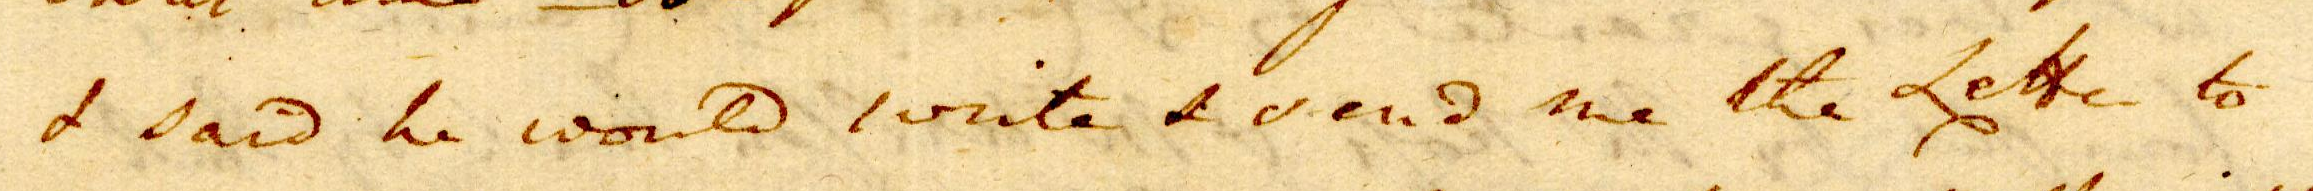& said he would write & send me the Letter to
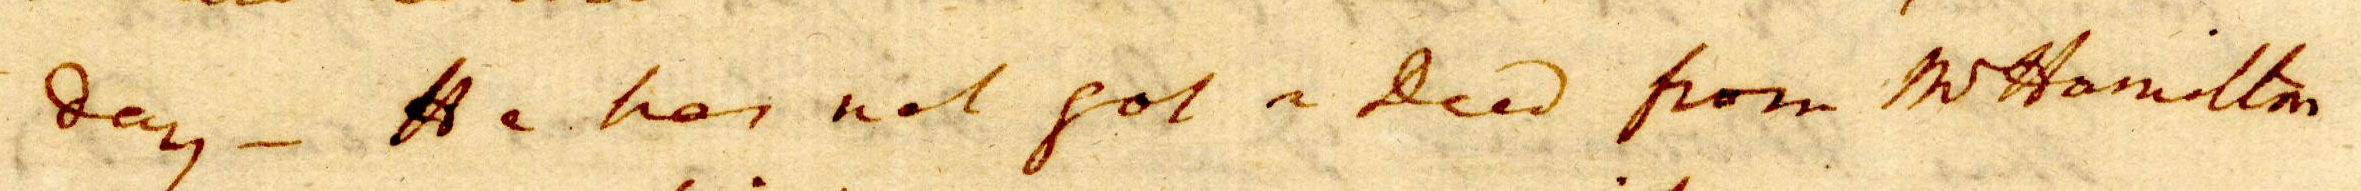-day. He has not got a Deed from M^r Hamilton
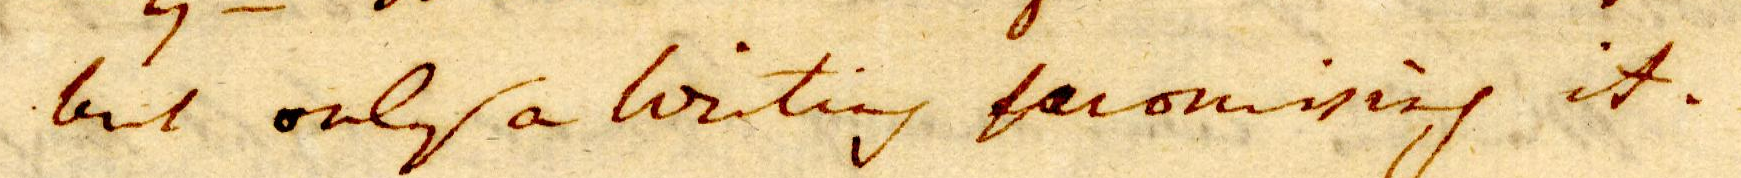but only a Writing promising it.
